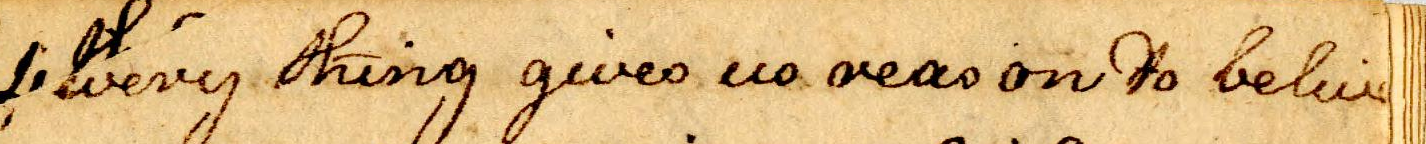every thing gives us reason to belive
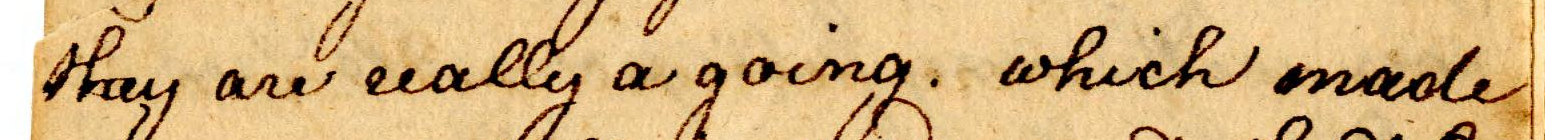they are really a going. which made
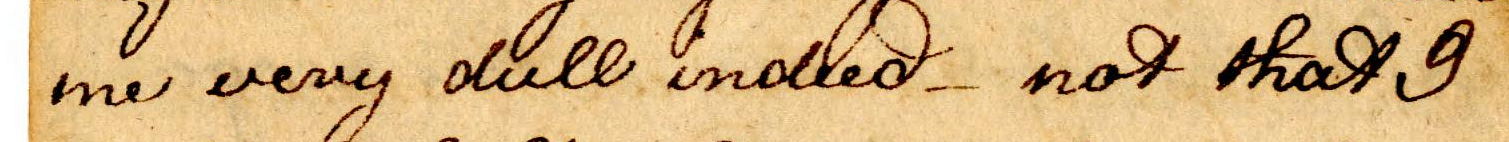me very dull indeed- not that I
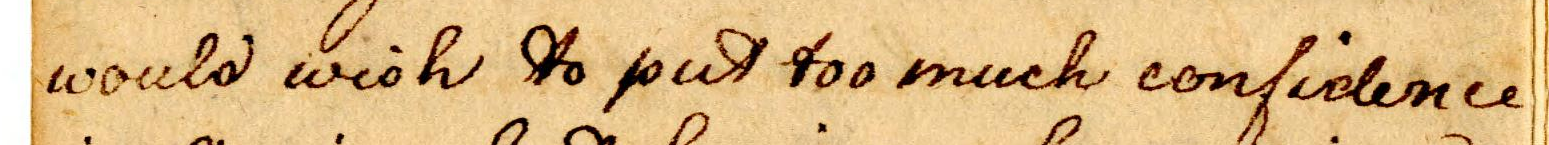would wish to put too much confidence
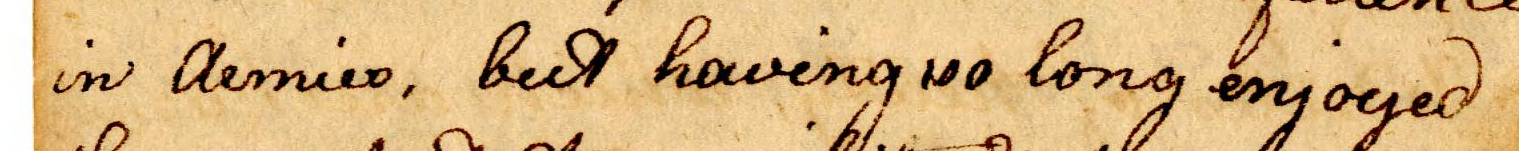in Armies, but having so long enjoyed
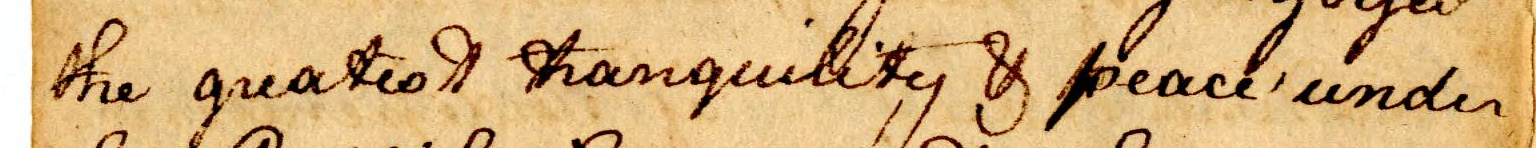the greatest tranquility & peace under
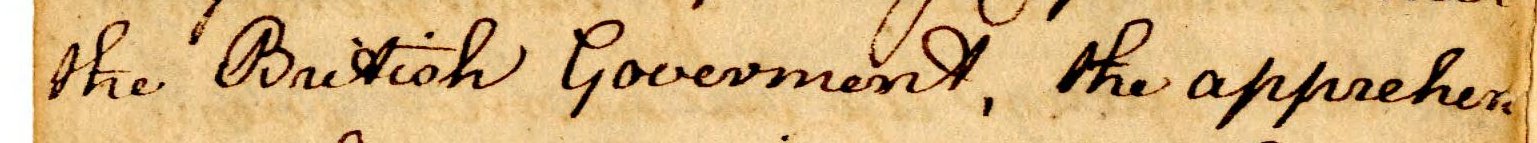the British Goverment, the apprehen
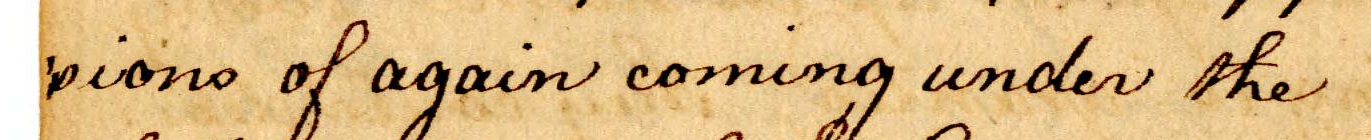-sions of again coming under the
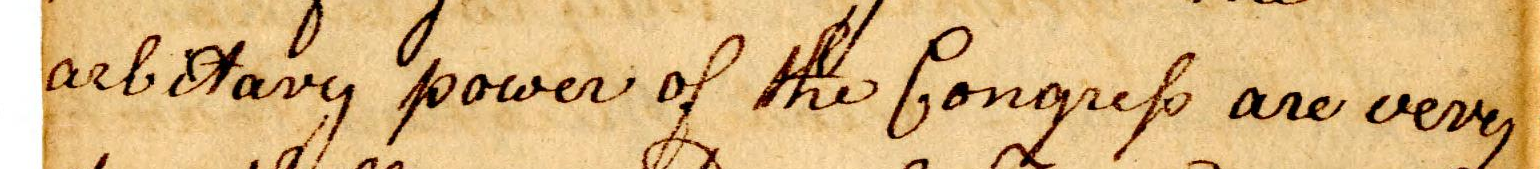arbitary power of the Congress are very
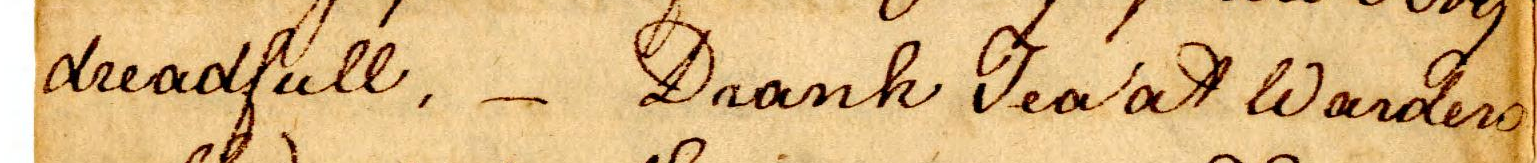dreadfull.- Drank Tea at Wardens
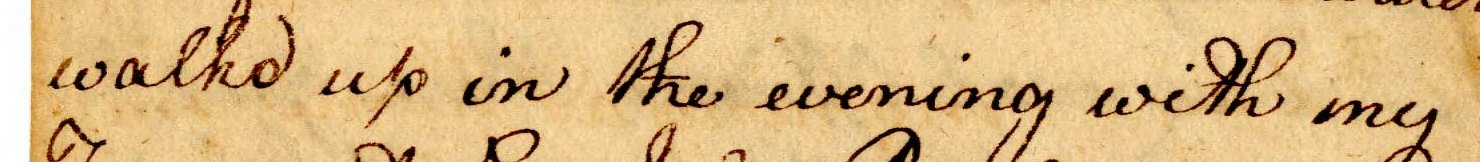walkd up in the evening with my
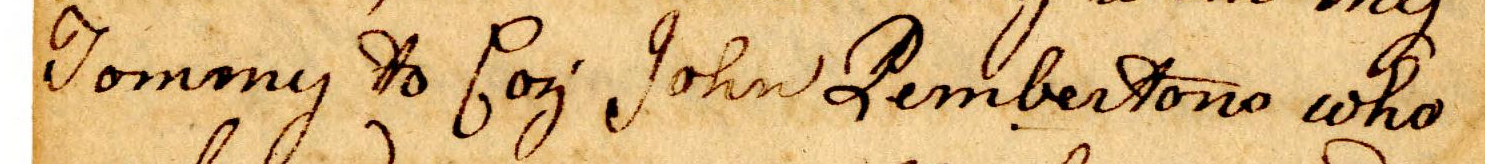Tommy to Coz John Pembertons who
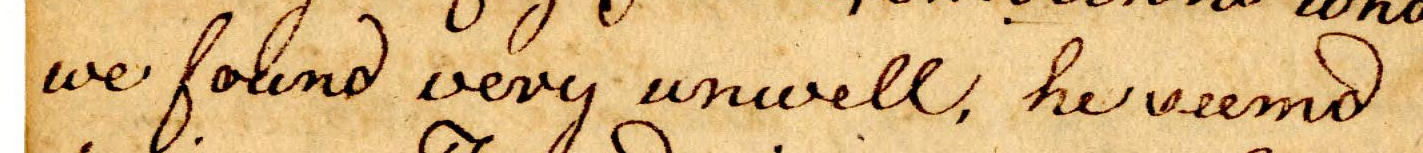we found very unwell, he seemd
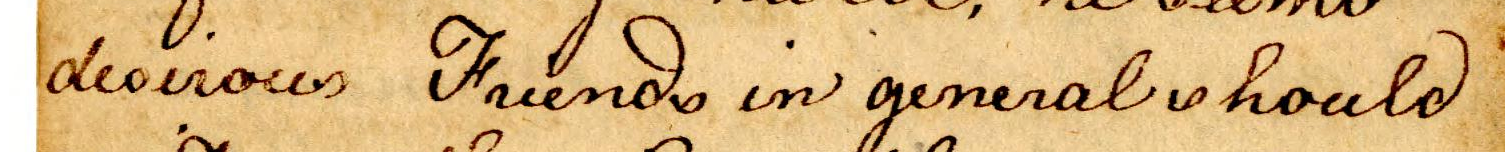desirous Friends in general should
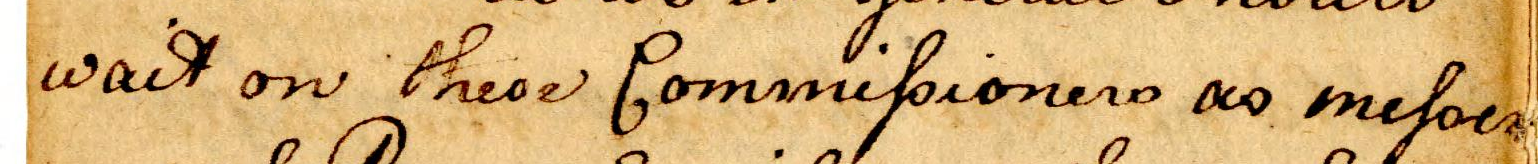wait on these Commissioners as messen
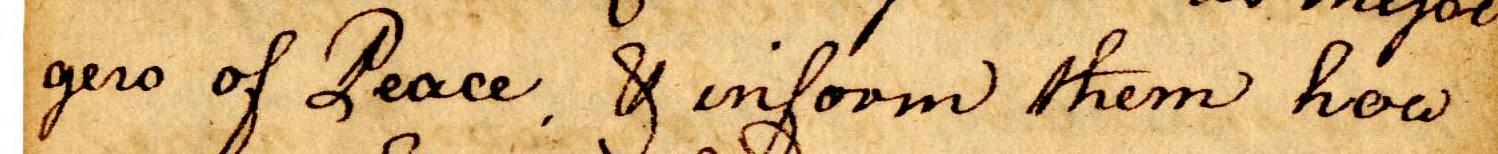gers of Peace & inform them how
